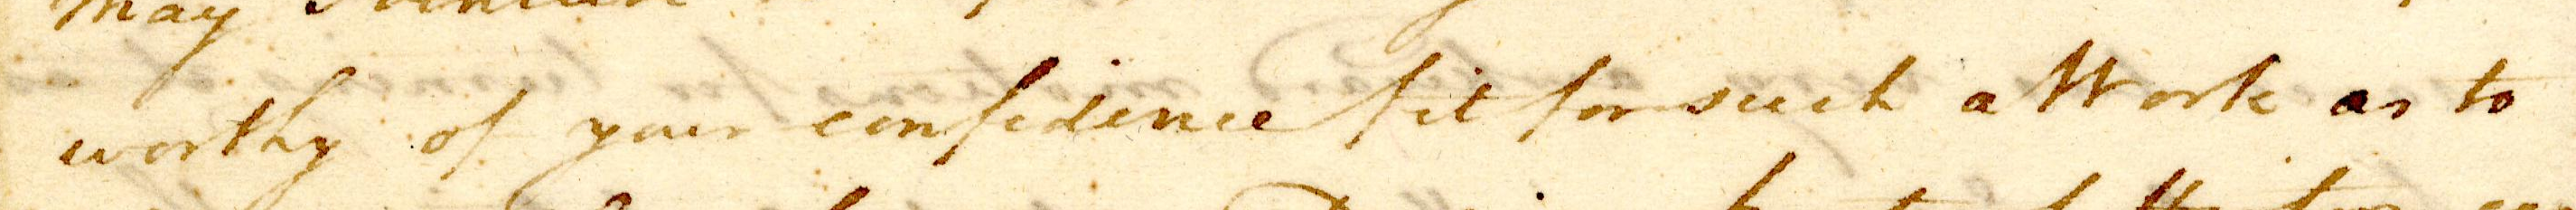worthy of your confidence fit for such a Work as to
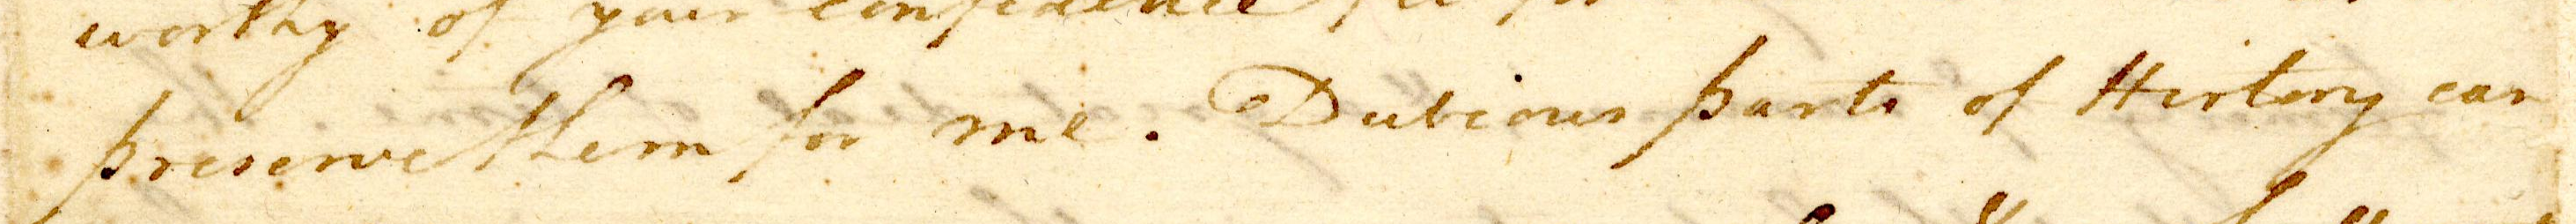preserve them for me. Dubious parts of History can
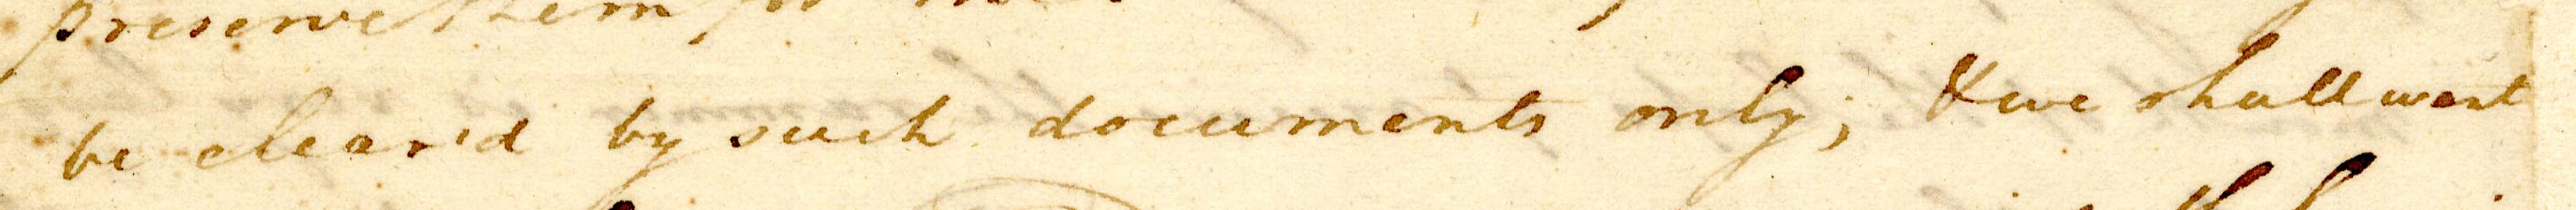be clear'd by such documents only; & we shall want
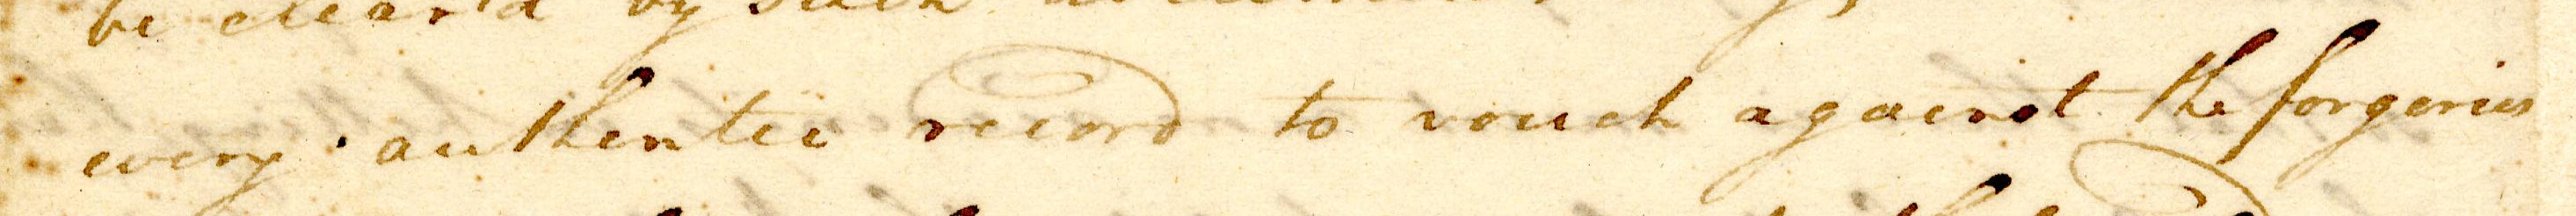every authentic record to vouch against the forgeries
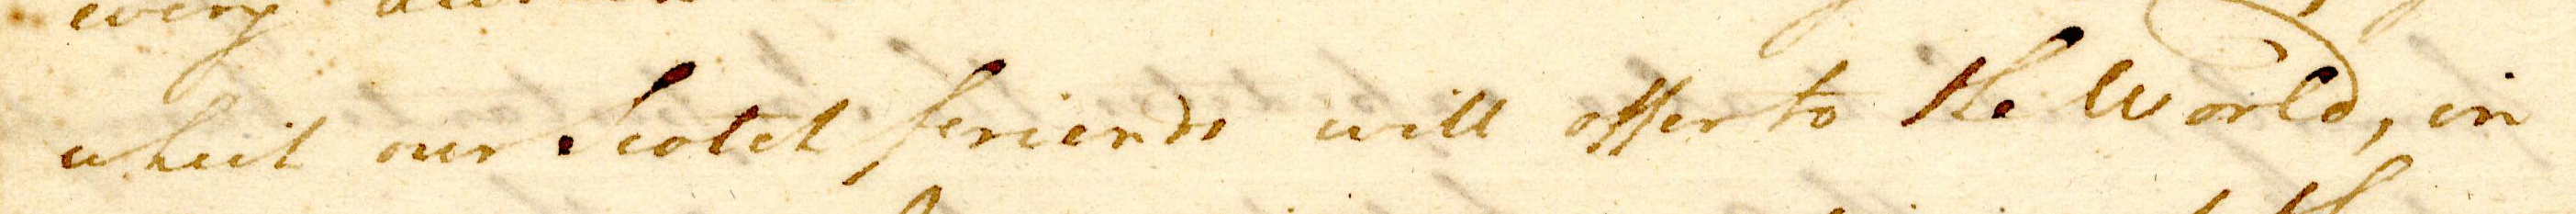whict our Scotch friends will offer to the world, in
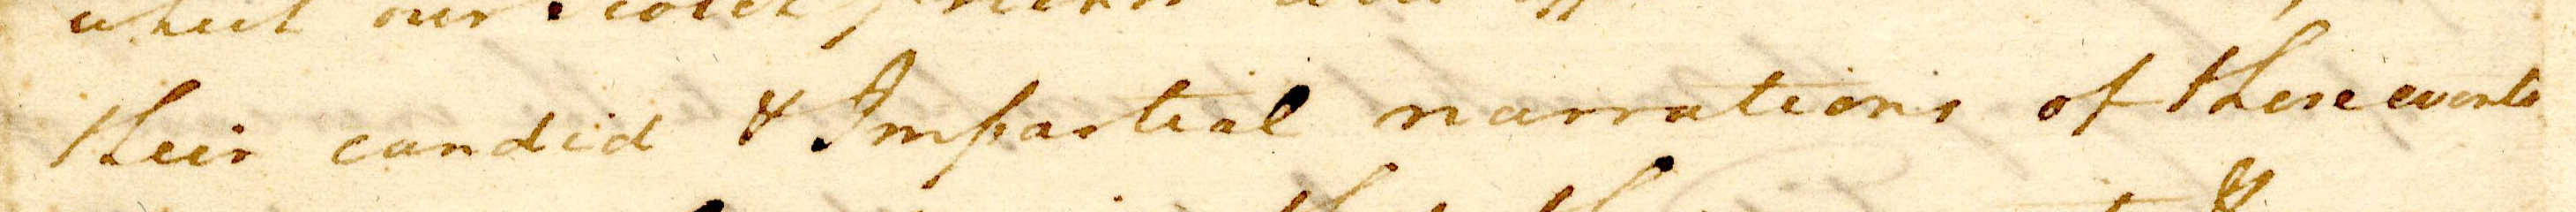their candid & Impartial narrations of these events
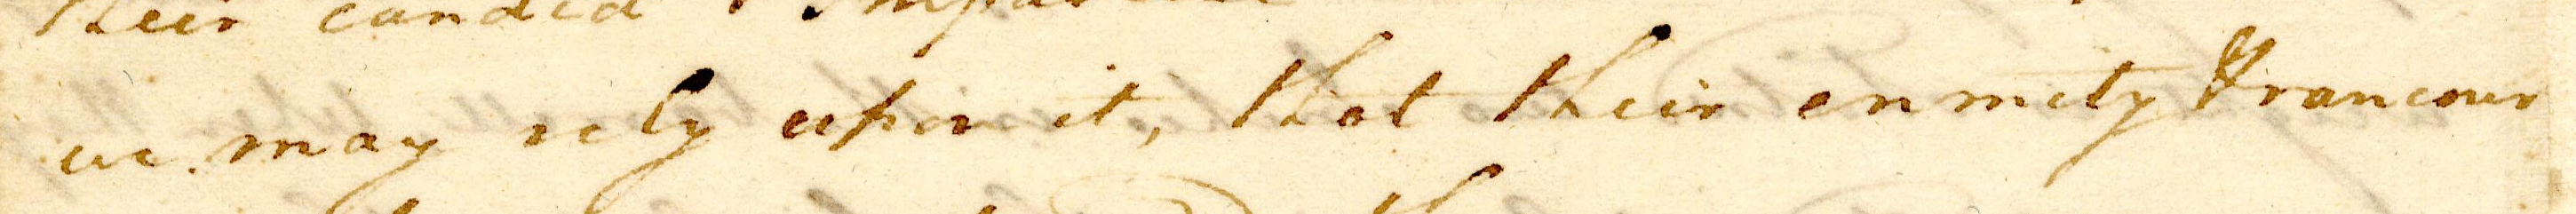we may rely upon it, that their enmity & rancour
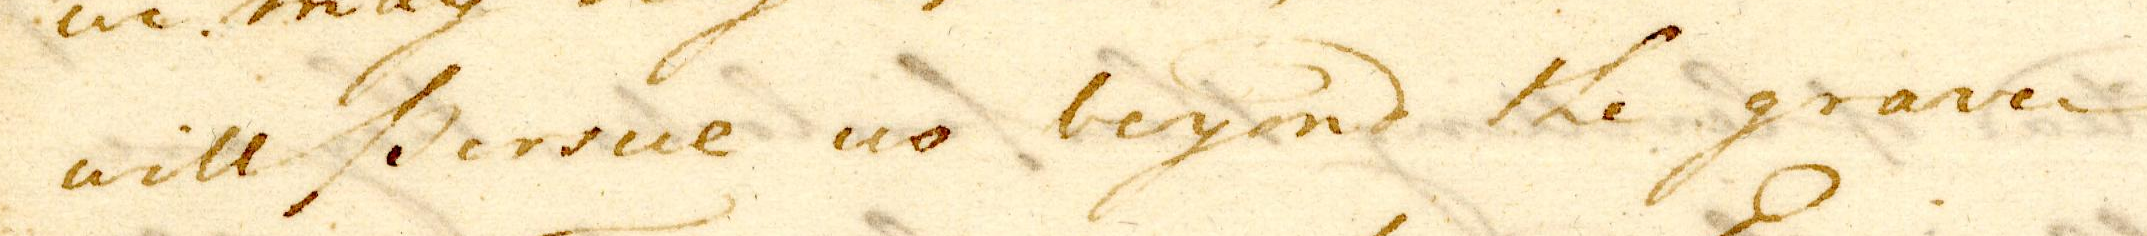will persue us beyond the grave-
